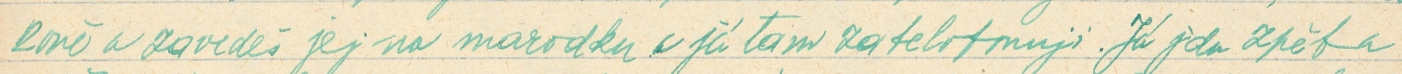koně a zavedeš jej na marodku a já tam zatelofonuji. Já jdu zpět a
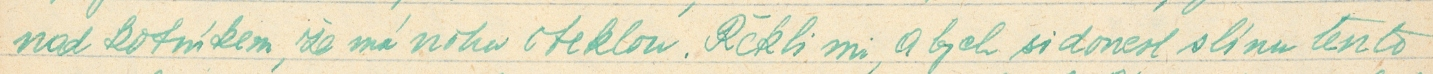nad kotníkem, že má nohu oteklou. Řekli mi, abych si donesl slínu tento
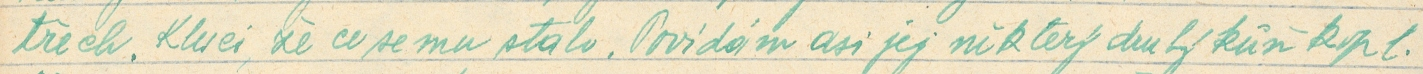třech. Kluci, že co se mu stalo. Povídám asi jej některý druhý kůň kopl.
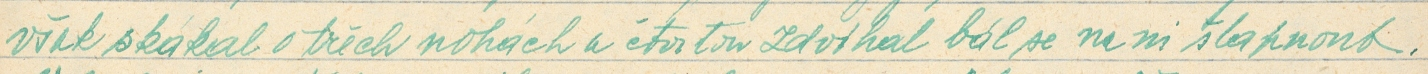však skákal o třech nohách a čtvrtou zdvíhal bál se na ni šlapnout.
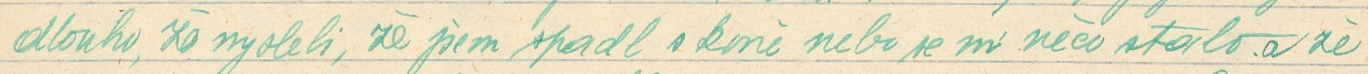dlouho, že mysleli, že jsem spadl s koně nebo se mi něco stalo a že
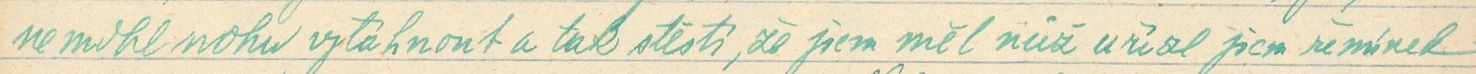nemohl nohu vytáhnout a tak stěstí, že jsem měl nůž uřízl jsem řemínek
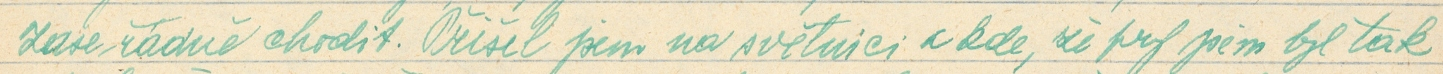zase řádně chodit. Přišel jsem na světnici a kde, že prý jsem byl tak
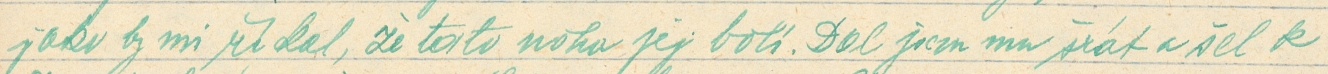jako by mi říkal, že tato noha jej bolí. Dal jsem mu šrát a šel k
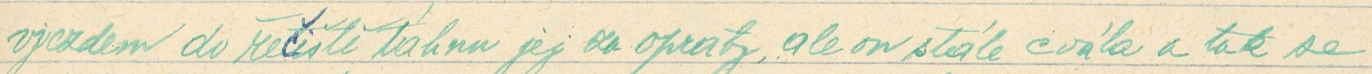vjezdem do řečiště táhnu jej za opraty, ale on stále cvála a tak se
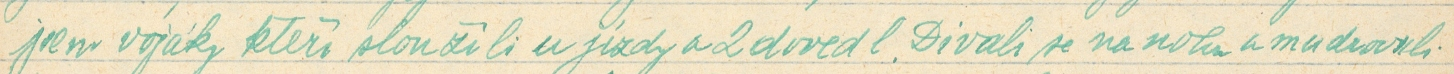jsem vojáky kteří sloužili u jízdy a 2 dovedl. Divali se na nohu a mudrovali
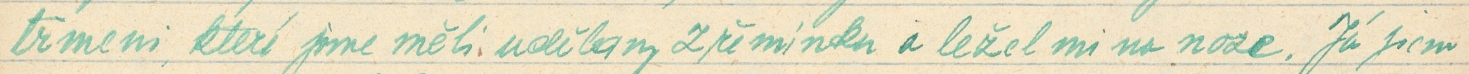třmeni, které jsme měli udělany z řemínku a ležel mi na noze. Já jsem
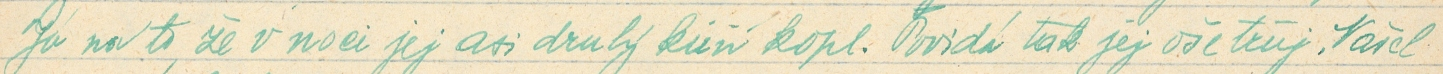Já na to, že v noci jej asi druhý kůň kopl. Povídá tak jej ošetřuj. Našel
